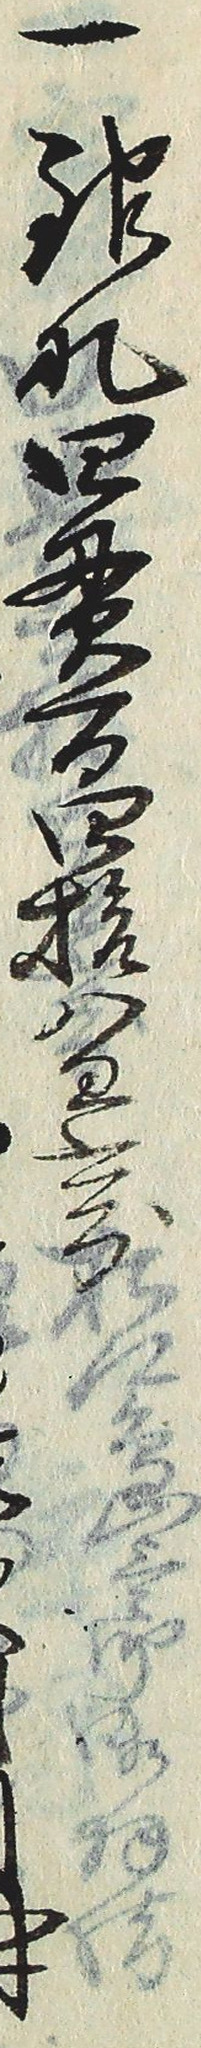一銀札四貫百四拾八匁六分
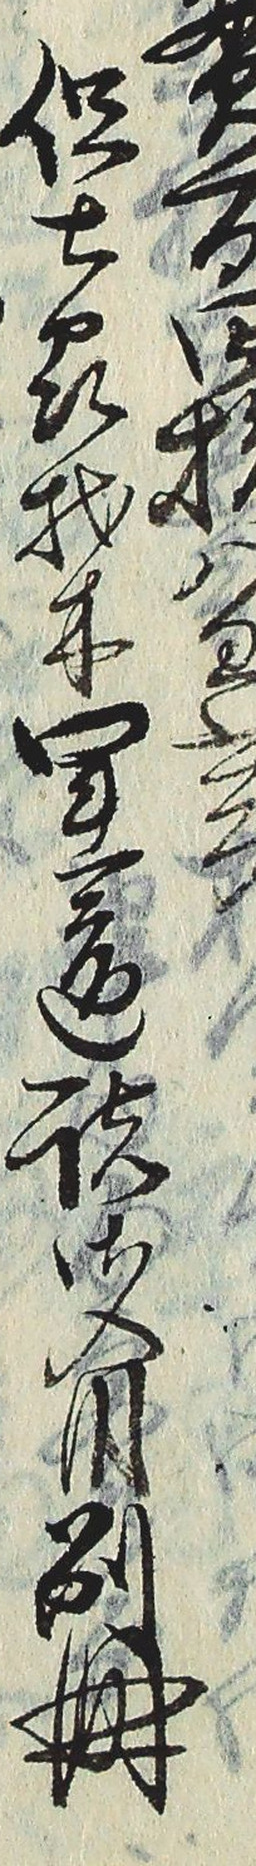但土州材木運送諸御入用別冊
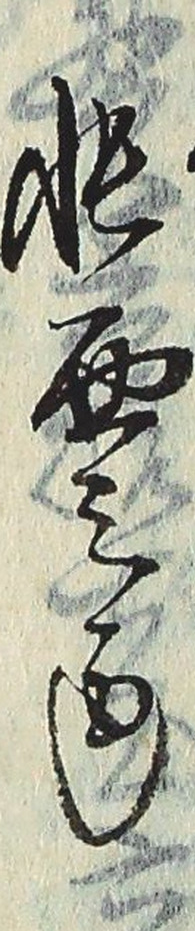帳面之通
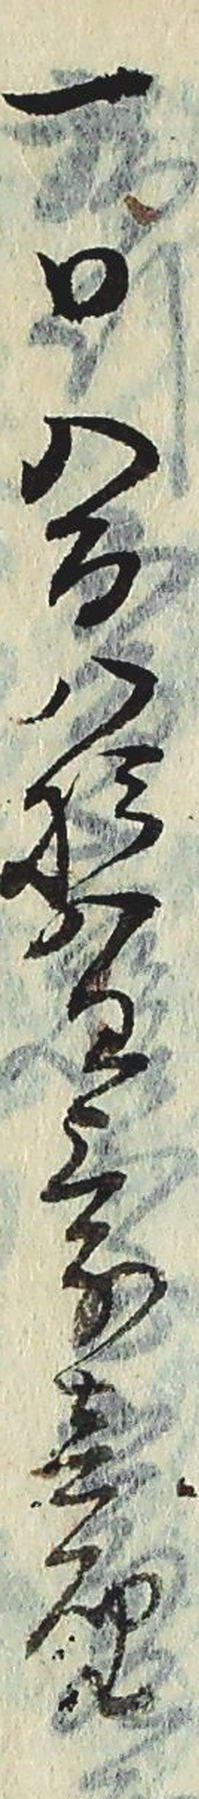一同八百八拾八匁三分壱厘
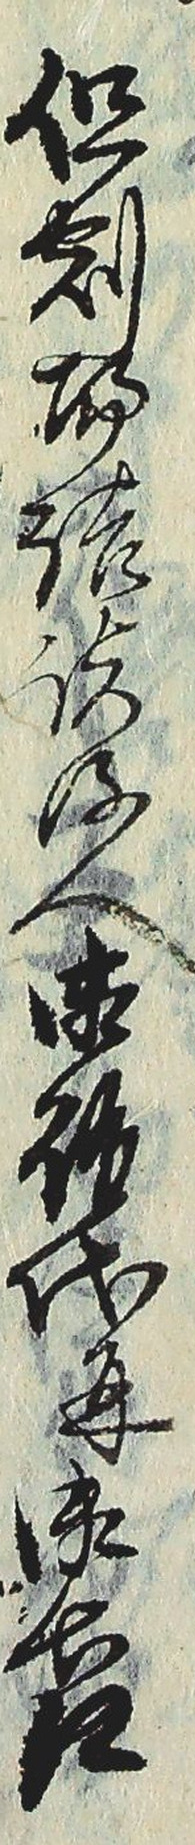但割場詰諸役人御賄代并御出郷
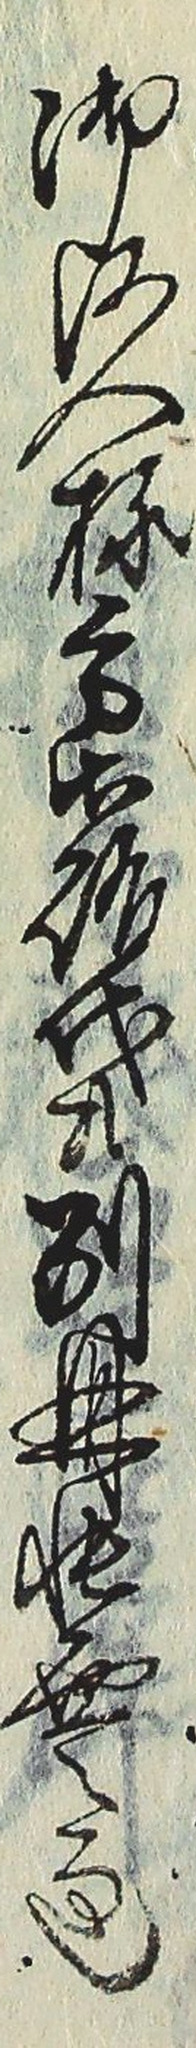御役人様方御賄代共別冊帳面之通
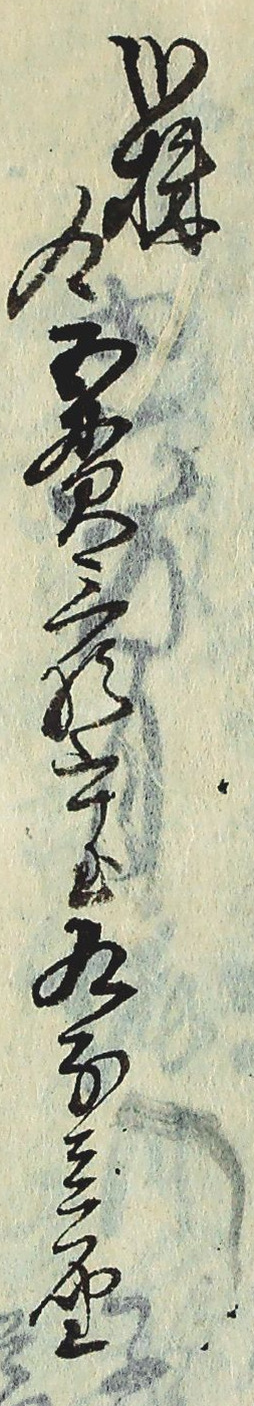合五貫三拾六匁九分壱厘
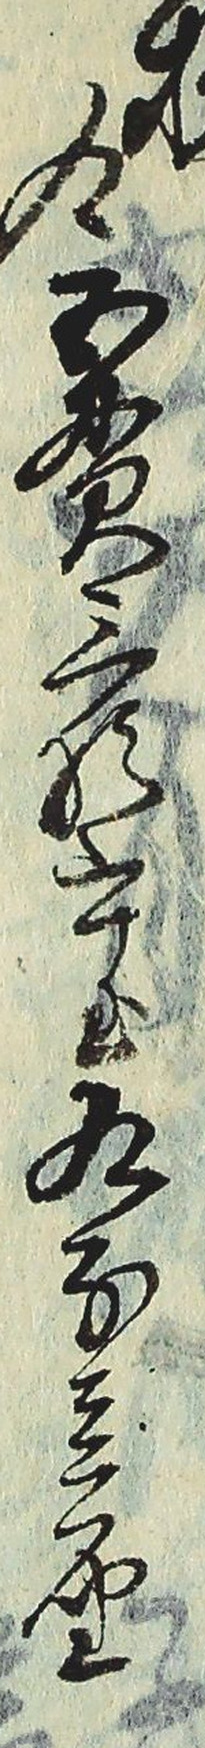合五貫三拾六匁九分壱厘
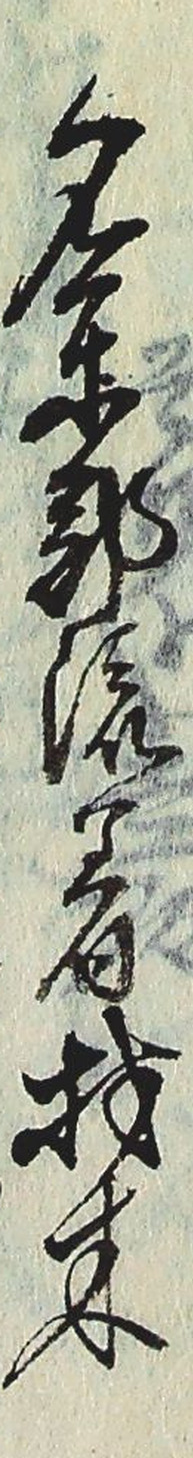名東郡流着材木
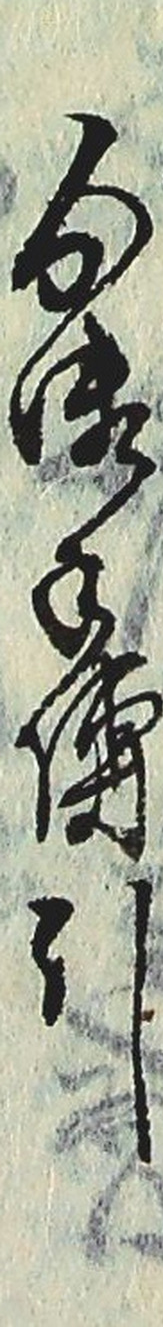ゟ御手伝引
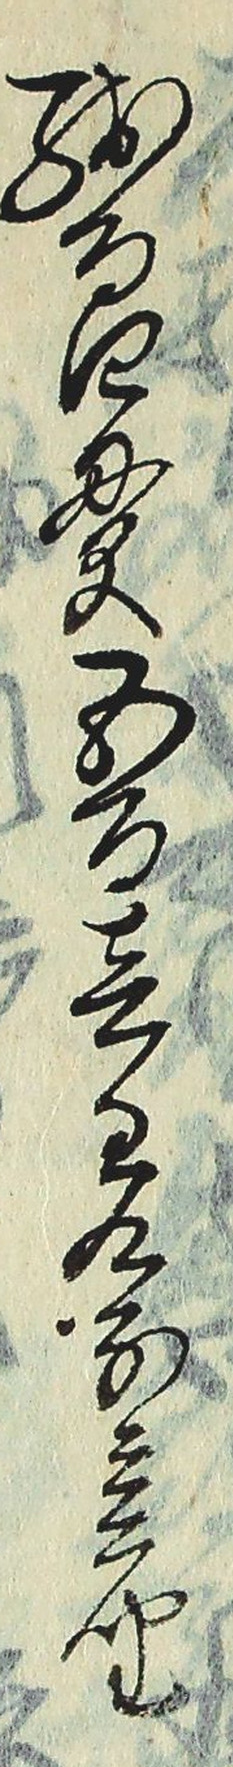残て四貫五百壱匁九分壱厘
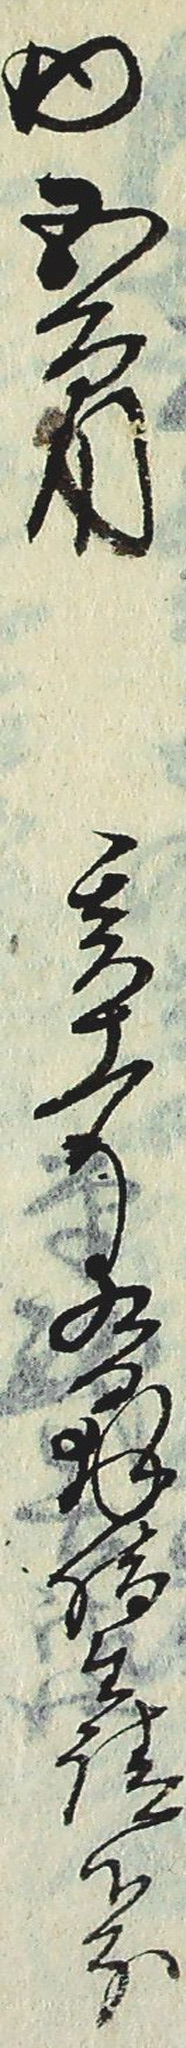内五百目亥十一月九日拝借主請下分
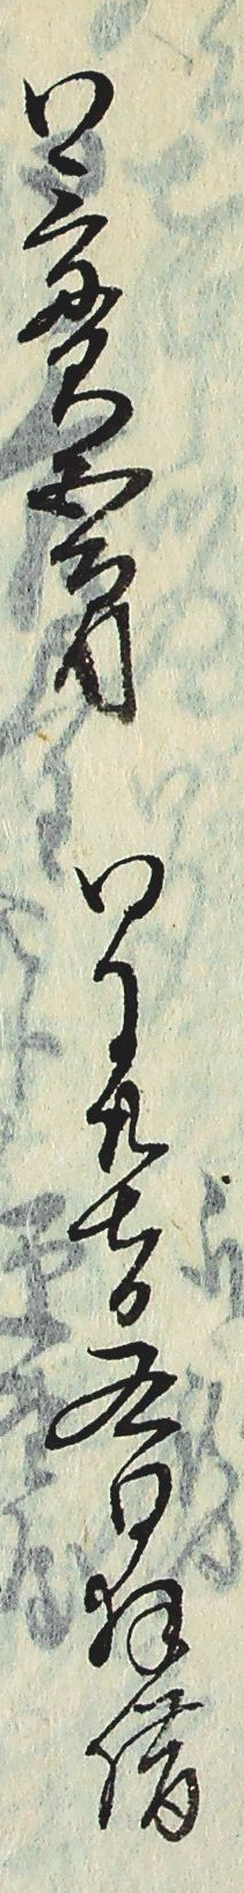同三貫五百目同月廿七日右同拝借

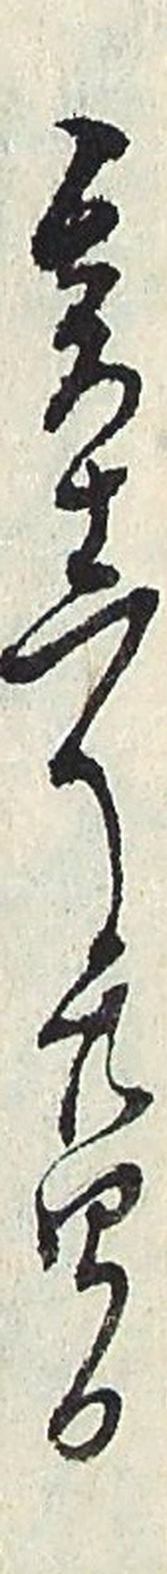亥十二月廿四日
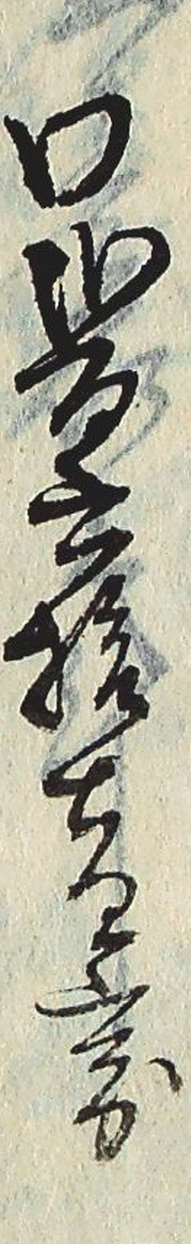〆五貫六拾七匁六分
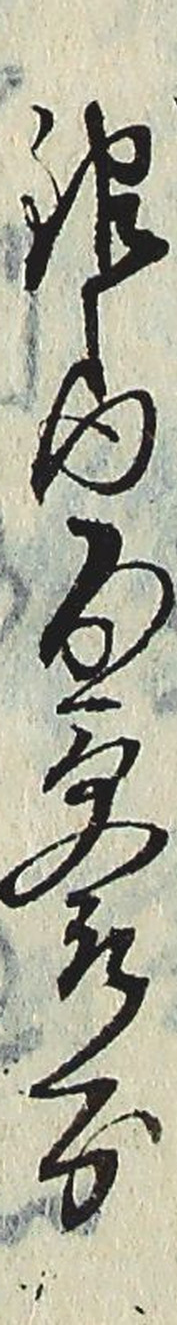銀之内ゟ受取分
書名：名東郡中諸割賦元帳
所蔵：鳴門教育大学 Naruto University of Education
